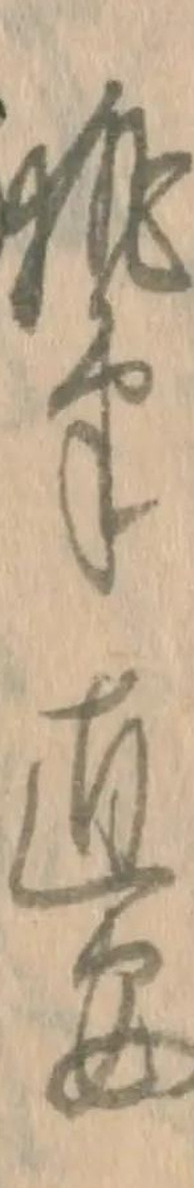執筆直安
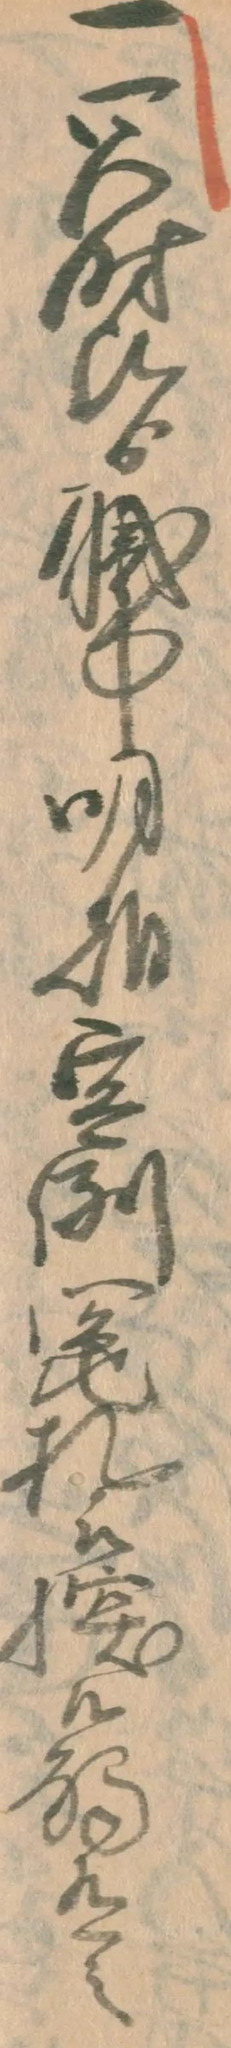一四ツ時比ゟ職中明朝定例鬮札被揬候触有之
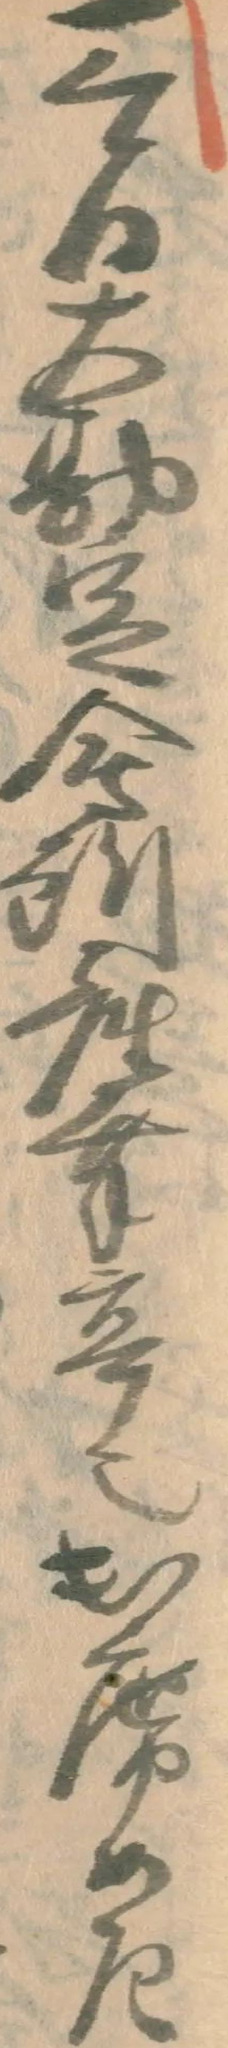一今日大勘定会所産幸亭也出席如左
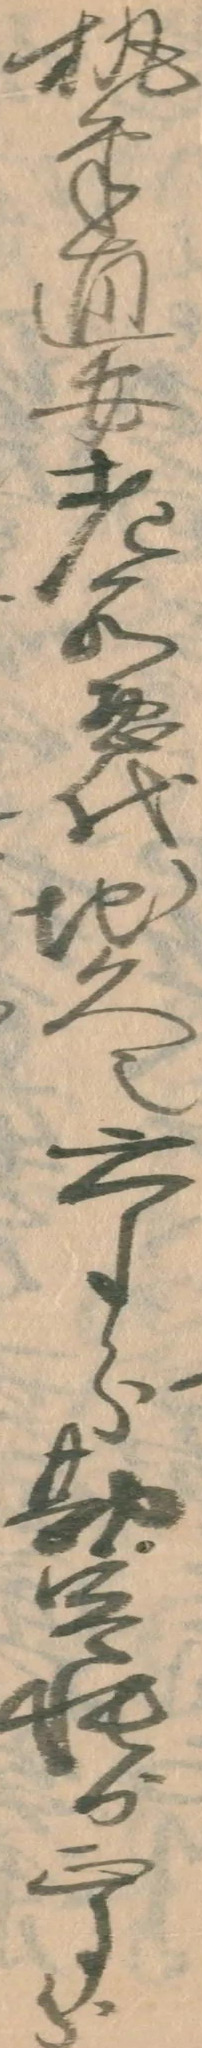執筆直安老若惣代地久也六月分勘定帳ゟ正月分
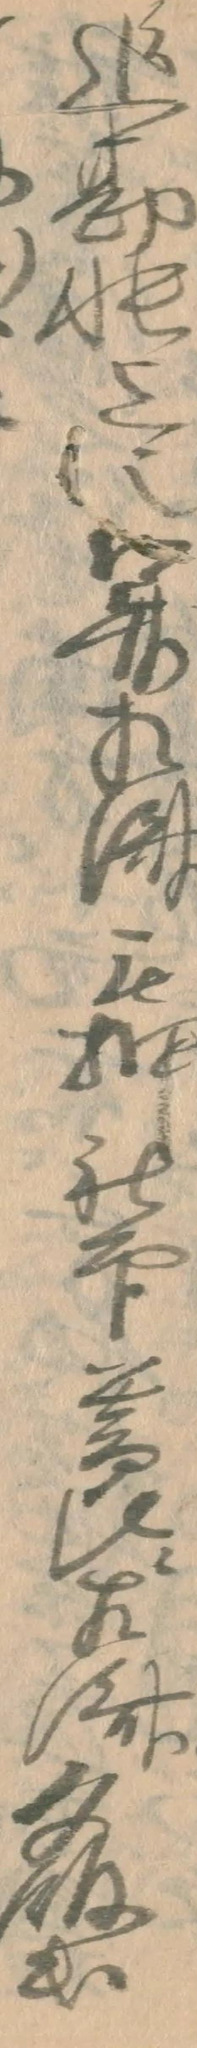追勘帳迄也算相済被押社印暮比ニ相済夕飯出
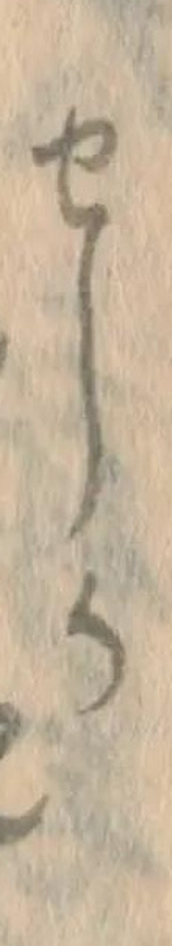せうか
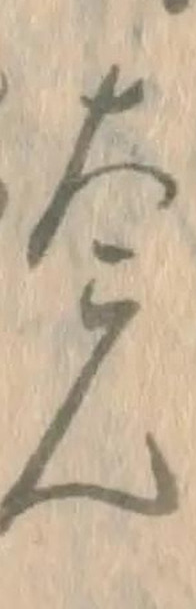大こん
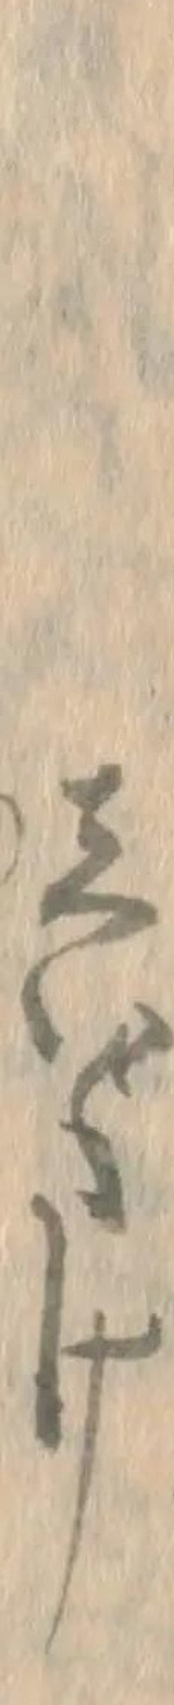しいたけ
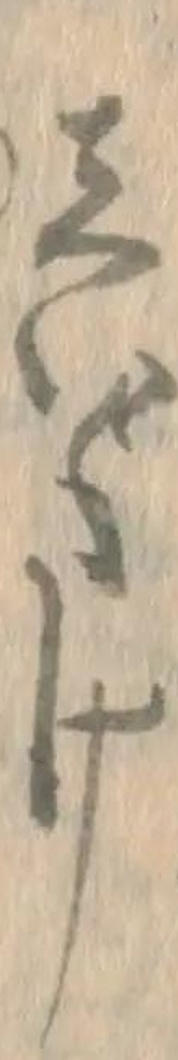しいたけ
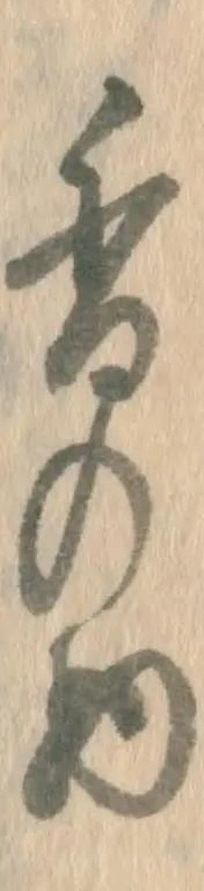香の物
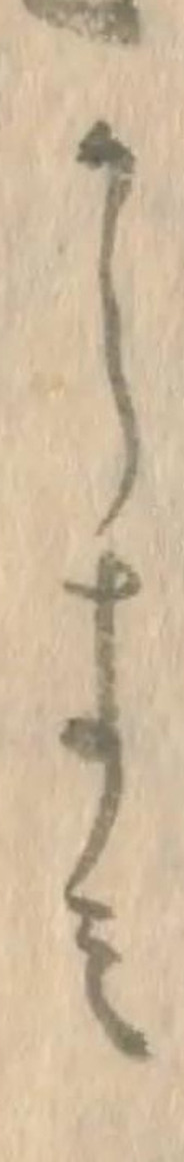からすみ
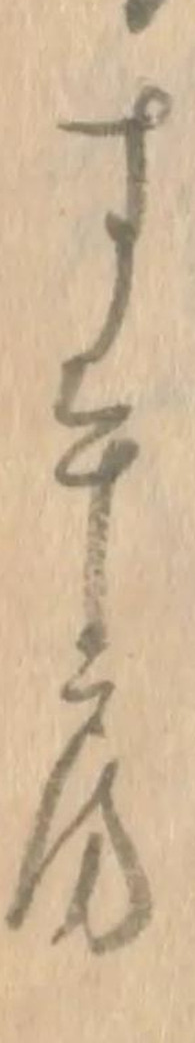す午房

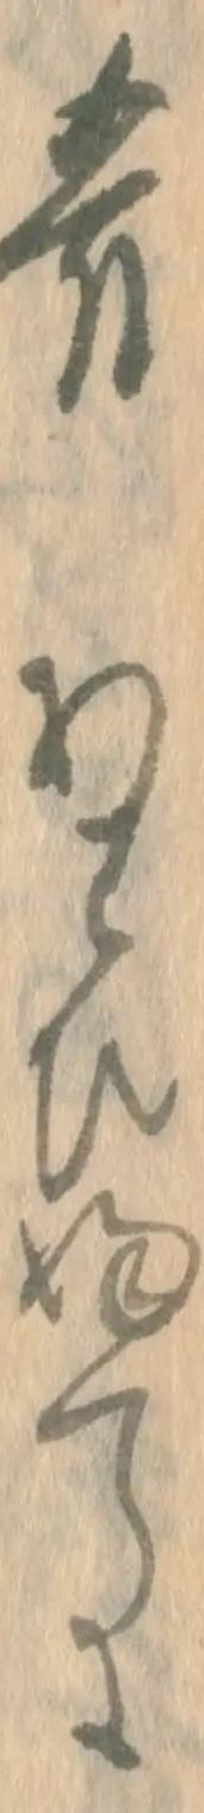肴わさひふてに
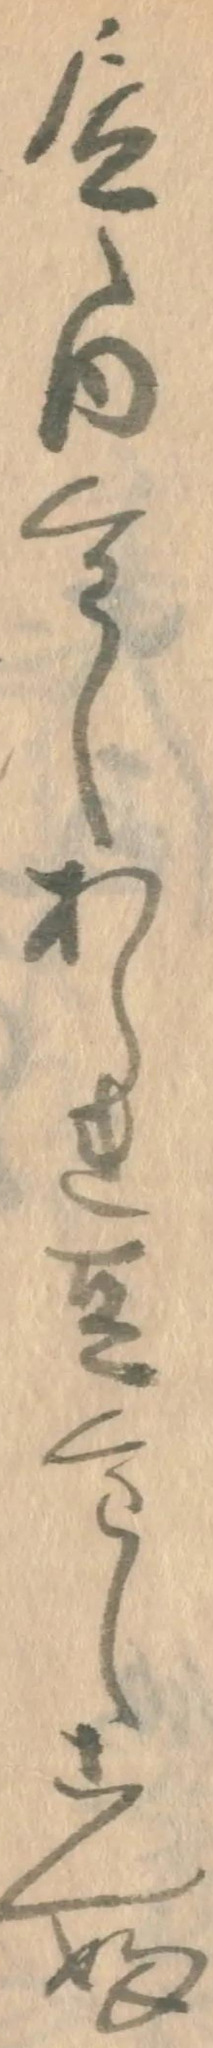昼之内くわしあられ豆くわしこんふ
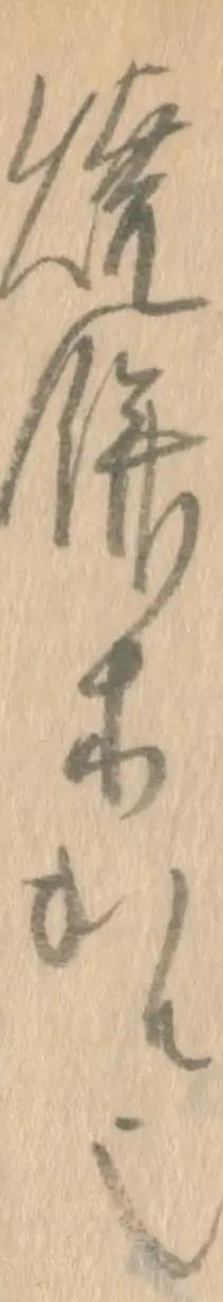焼餅等出ル也
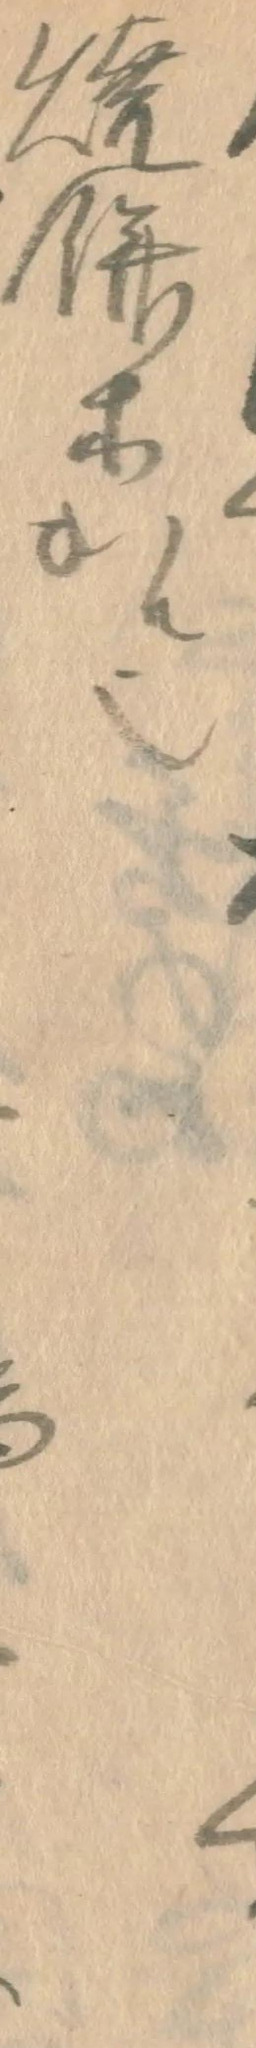焼餅等出ル也
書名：賀茂社記録. 第60冊
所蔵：国立国会図書館 National Diet Library, JAPAN
